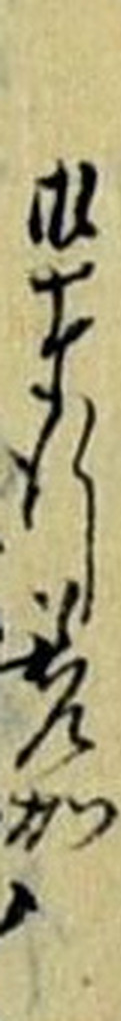御奉行差加
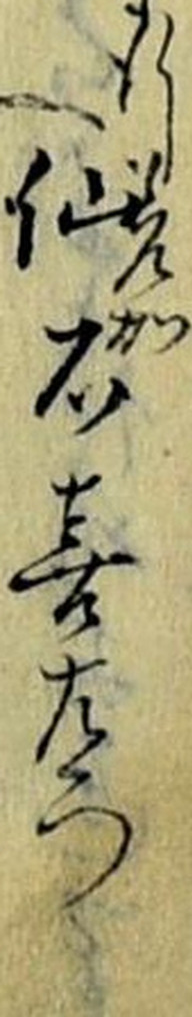仙石喜左衛門
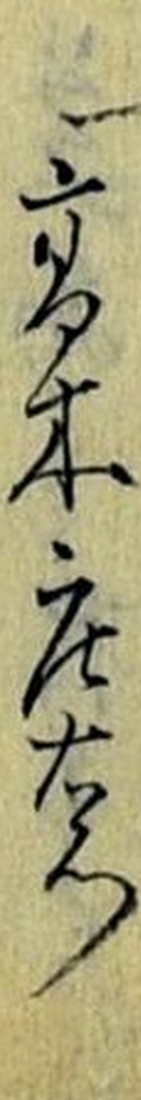高木庄右衛門
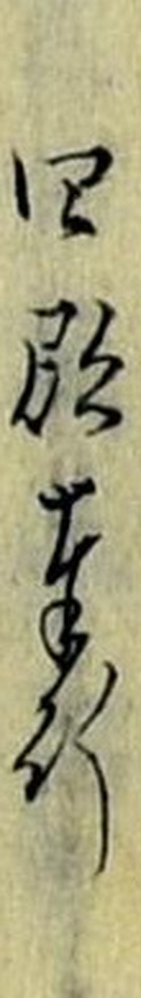四郡奉行
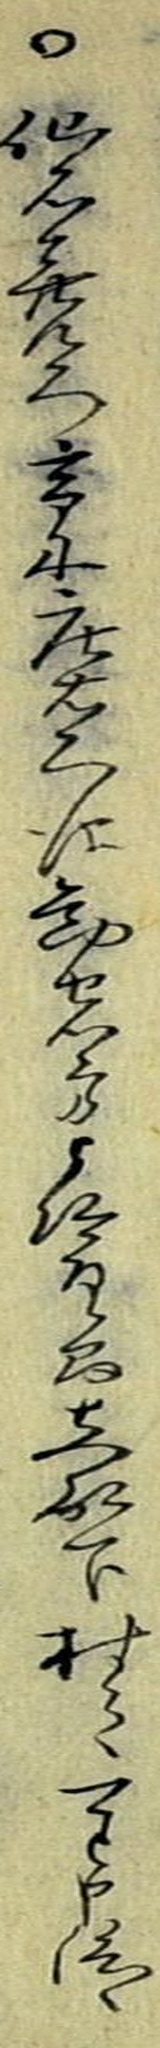○仙石喜左衛門高木庄右衛門儀勧農方被仰付候間支配下村々へ可被申渡候
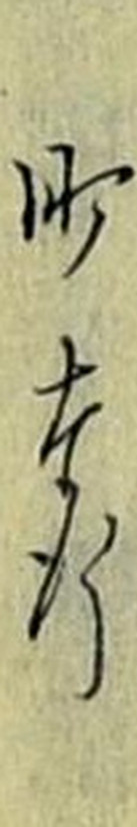御奉行
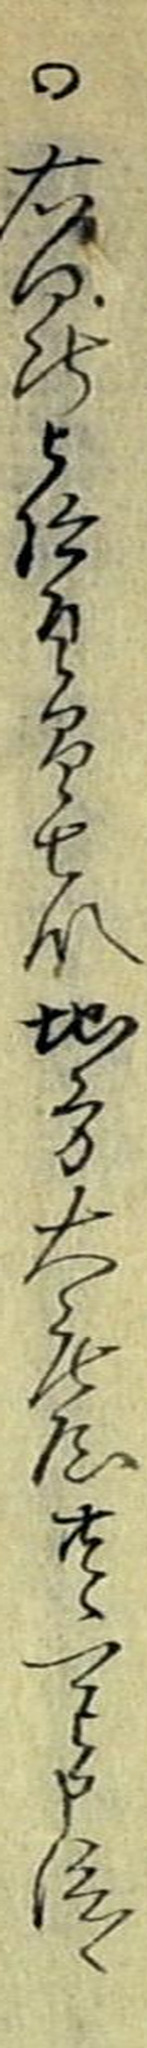○右同断被仰付候間其段地方庄屋共へ可被申渡候
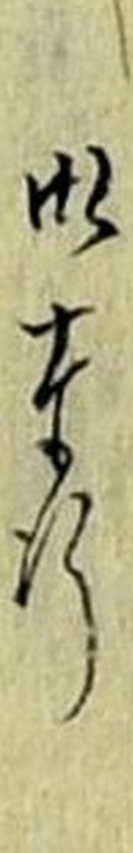御奉行
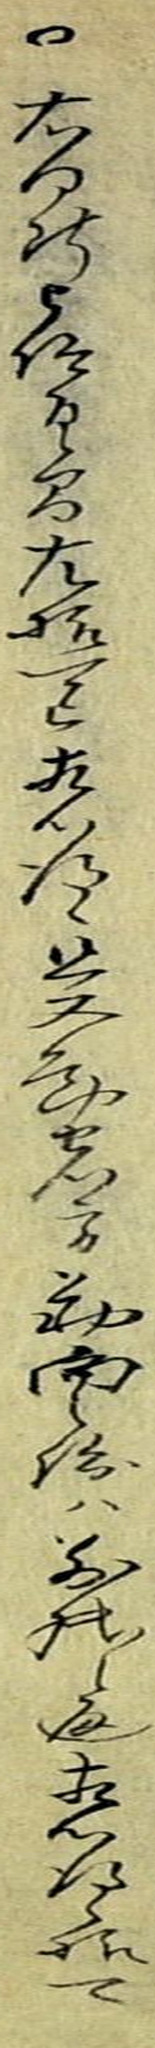○右同断被仰付候間左様可被相心得候且又勧農方勤向之儀は別紙之通相心得候様可
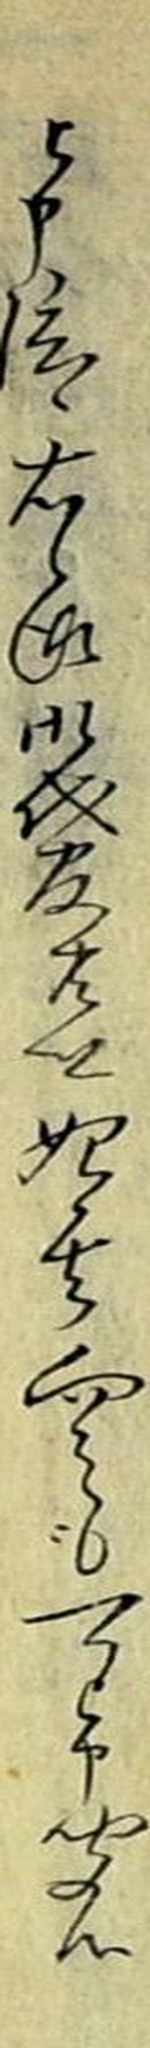被申渡候右之趣御代官共を始其向々へも可被申聞候
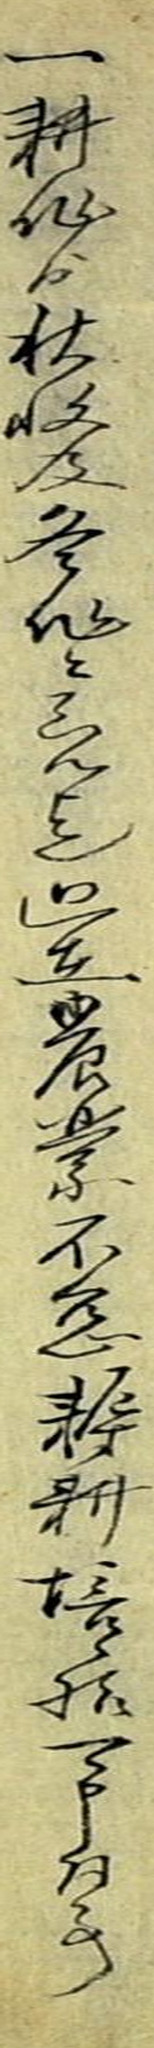一耕作ゟ秋収及冬作に至迄廻在農業不怠耨耕培候様可申付事
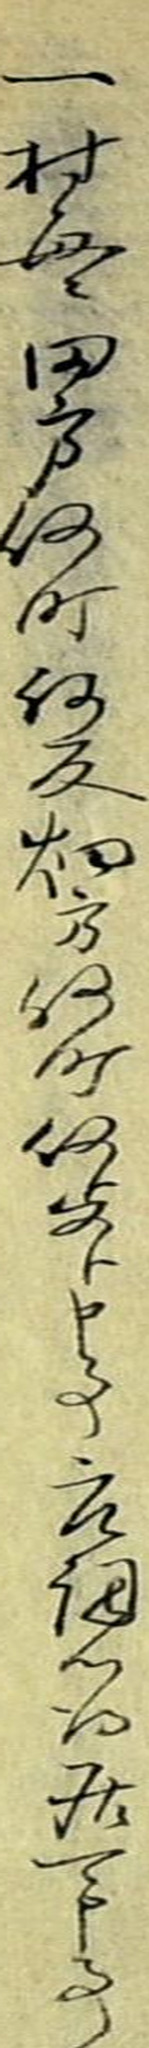一村毎に田方何町何反畑方何町何歩と申事取調心得居可申事
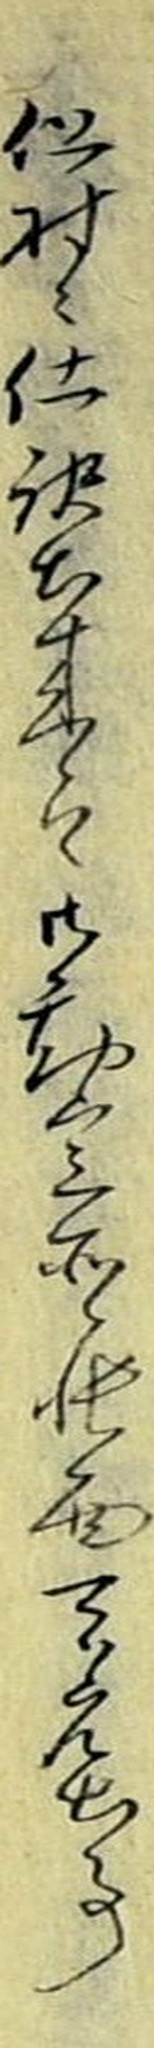但村々仕訳出来候はヽ御勘定所へ帳面可差出事
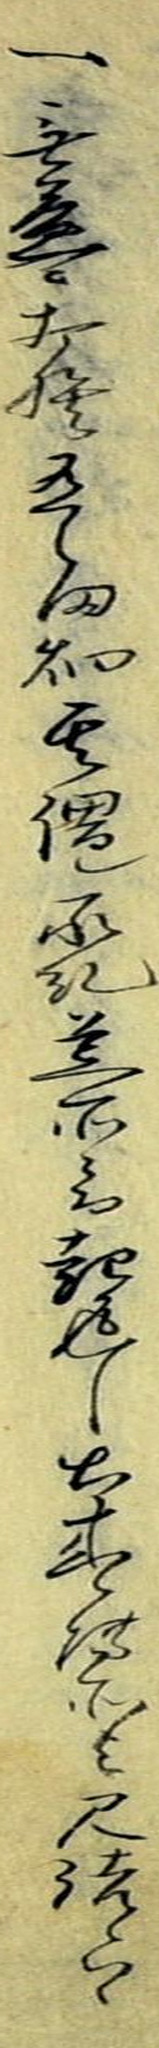一無益に打捨有之田畑其謂レ承糺荒所に而起返し出来候場所と見詰候はヽ

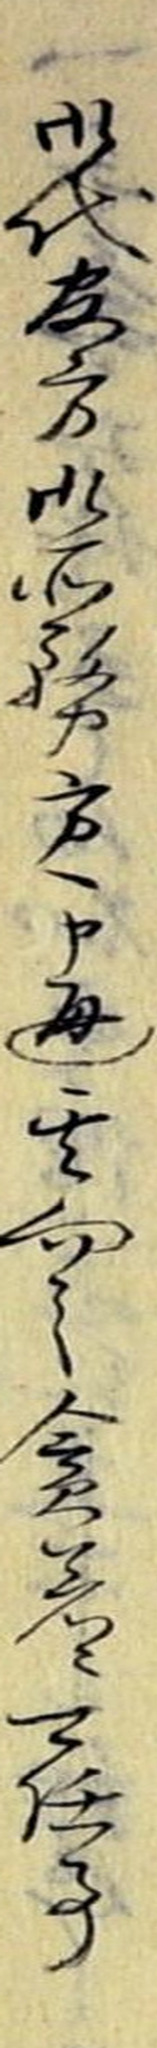御代官方御所務方へ申達其向々之貪着に可任事
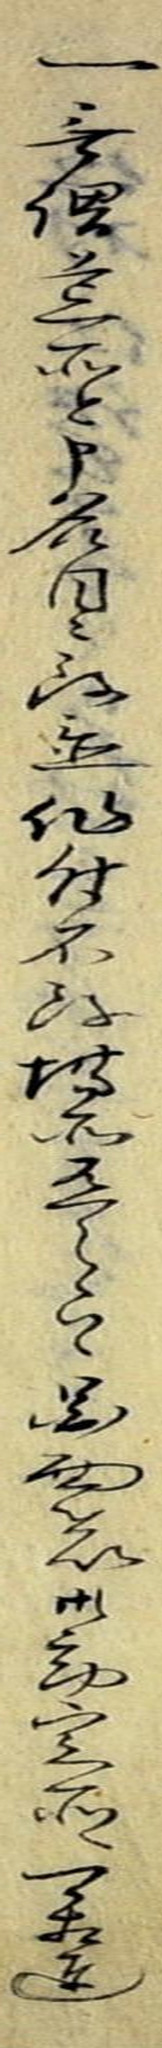一無謂荒所と申名目に致置作付不致場所有之候はヽ図面を以御勘定所へ可相達
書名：命令之部 六
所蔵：福井県文書館 Fukui Prefectural Archives
